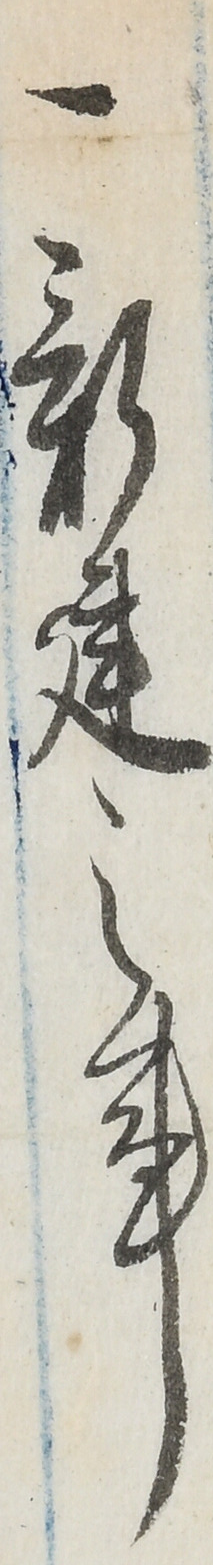一新建之事
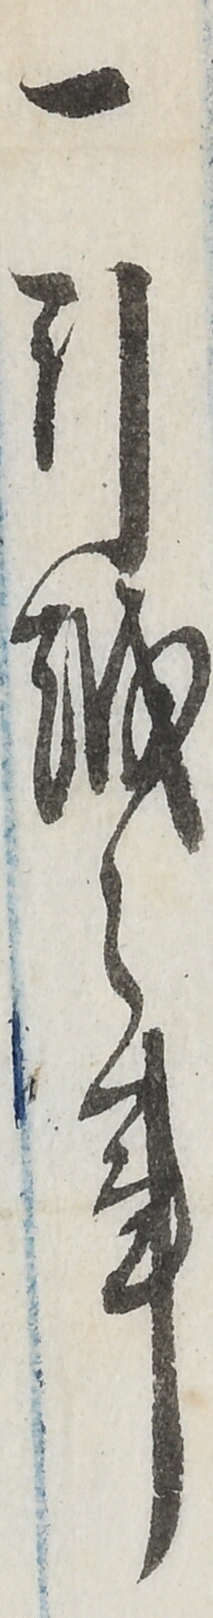一引越之事
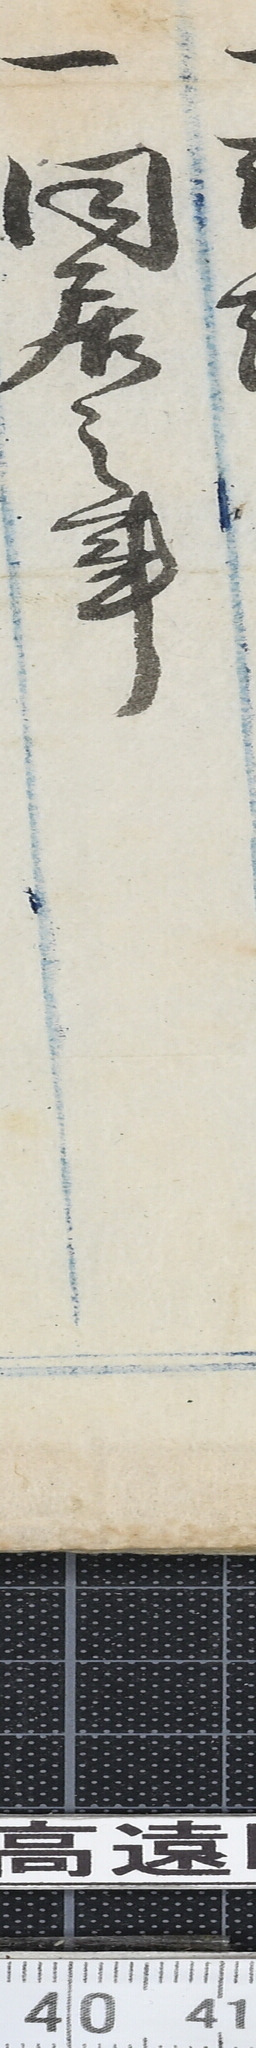一同居之事
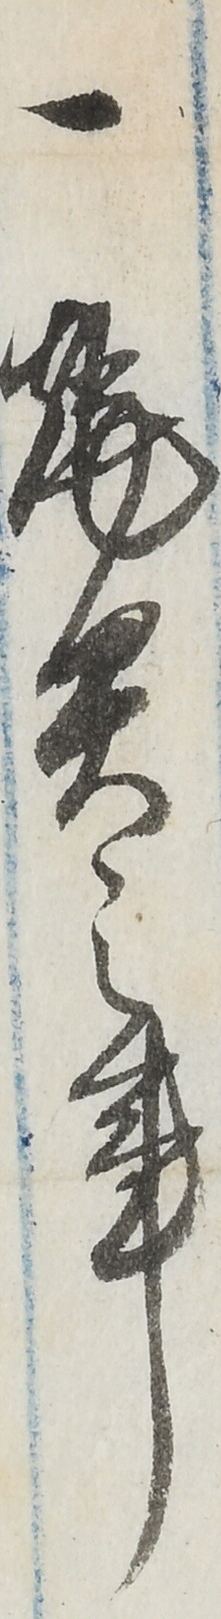一焼失之事
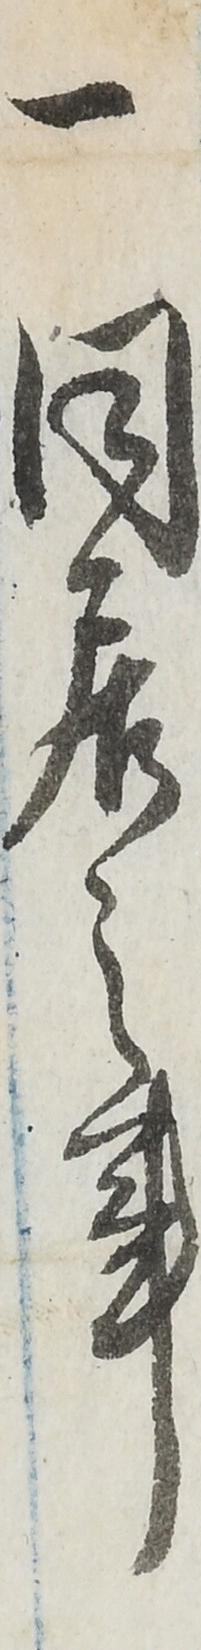一同居之事

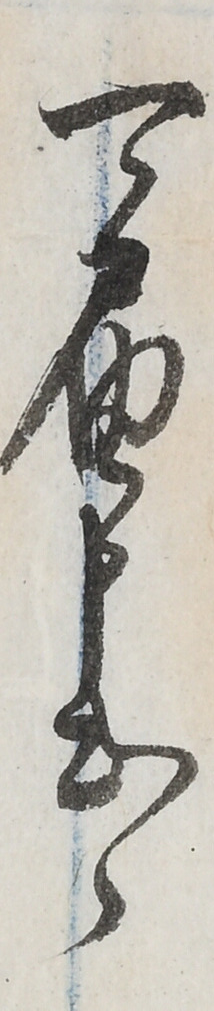可届申出候
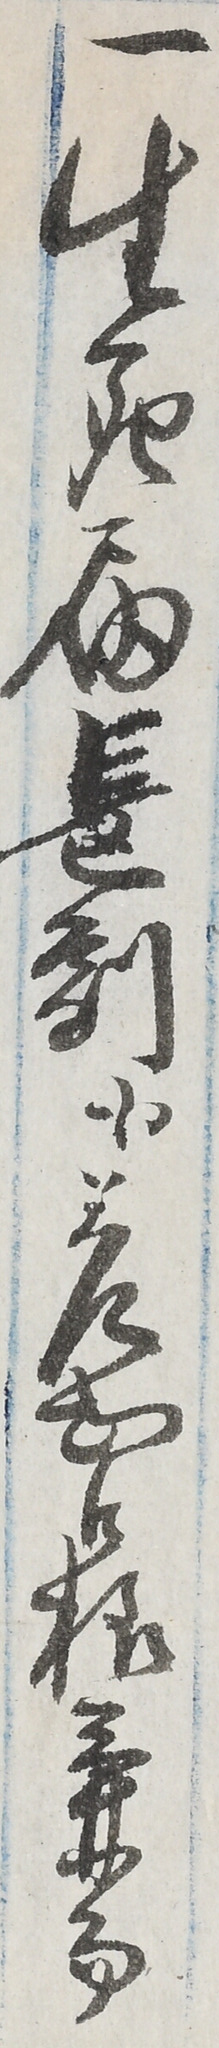一生死届長副江差出候様兼而
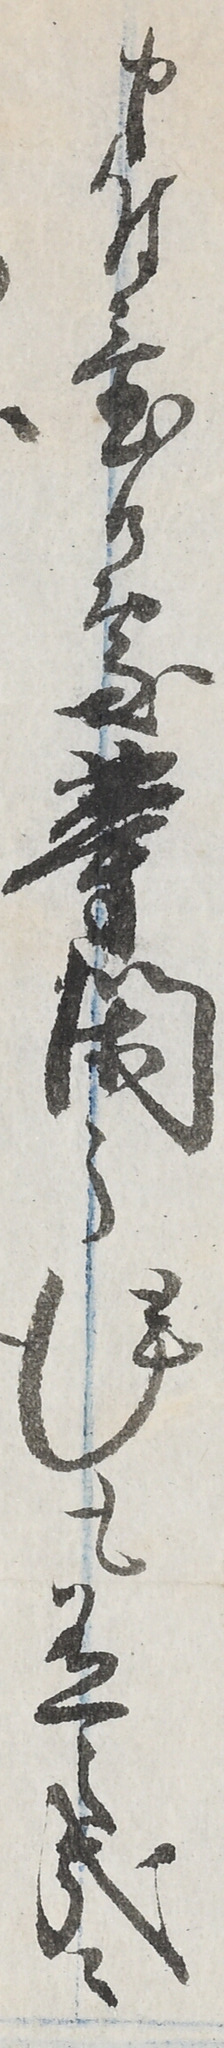申付置候処等閑之趣も有之哉ニ
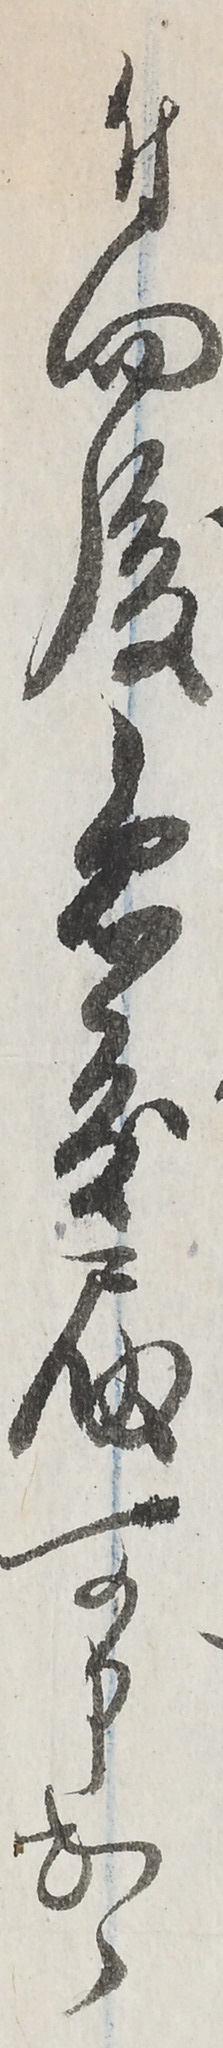付向後急度届可申出候
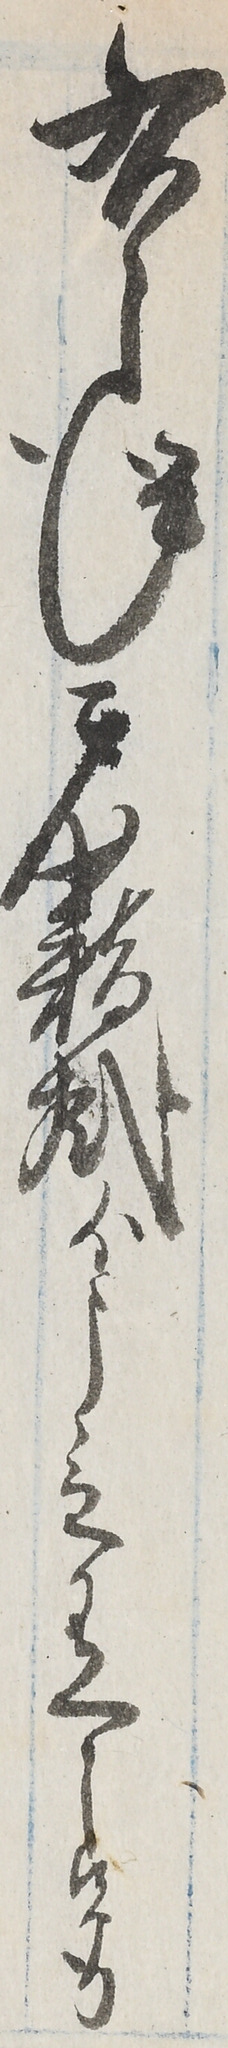右之趣戸籍掛ゟ申立有之候間
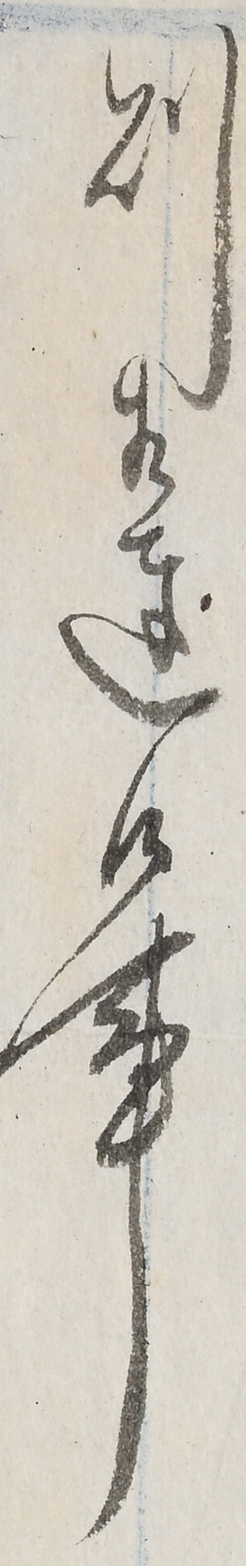則相達候事
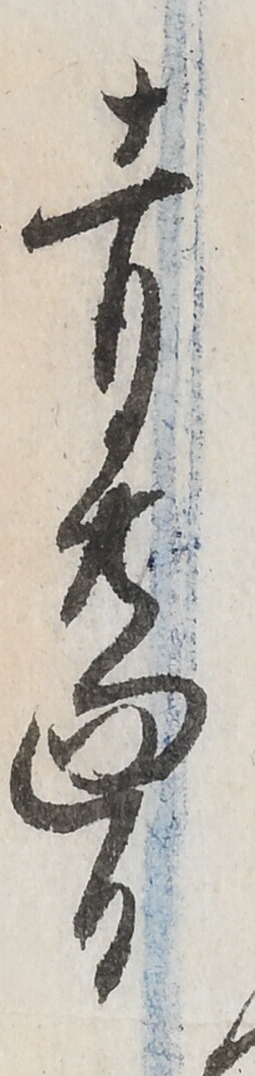十一月廿四日
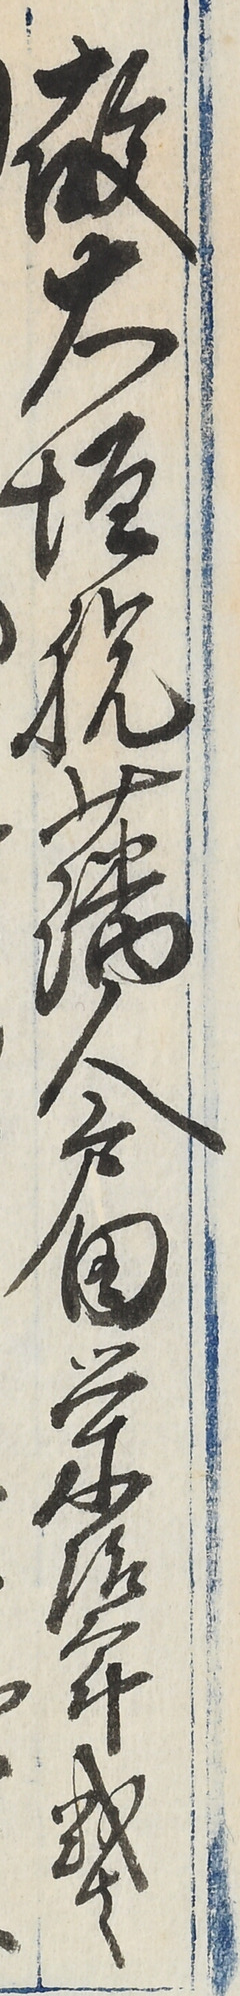故大垣祝藩人戸田栄治郎或者
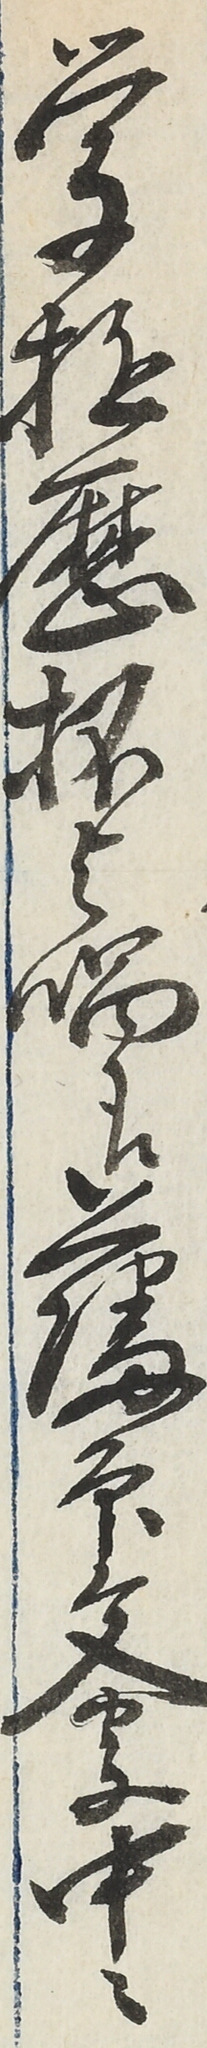学遊歴抔与唱江藩印文字中ニ
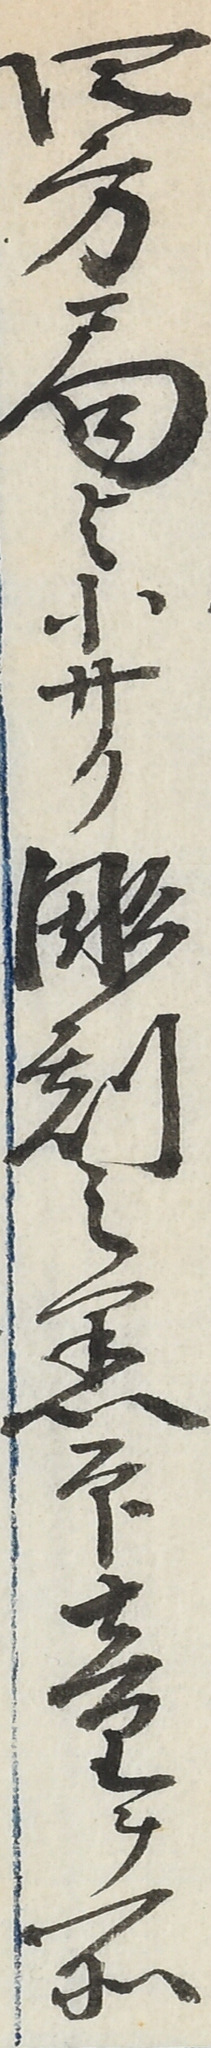四方局与小サク彫刻之黒印章ヲ所
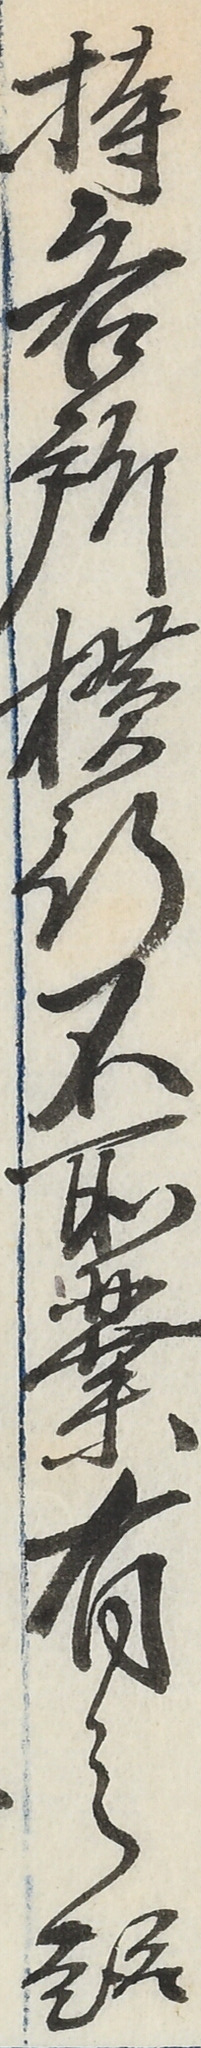持各所横行不所業有之趣
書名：布達書留
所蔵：伊那市立高遠町図書館・合同会社AMANE
